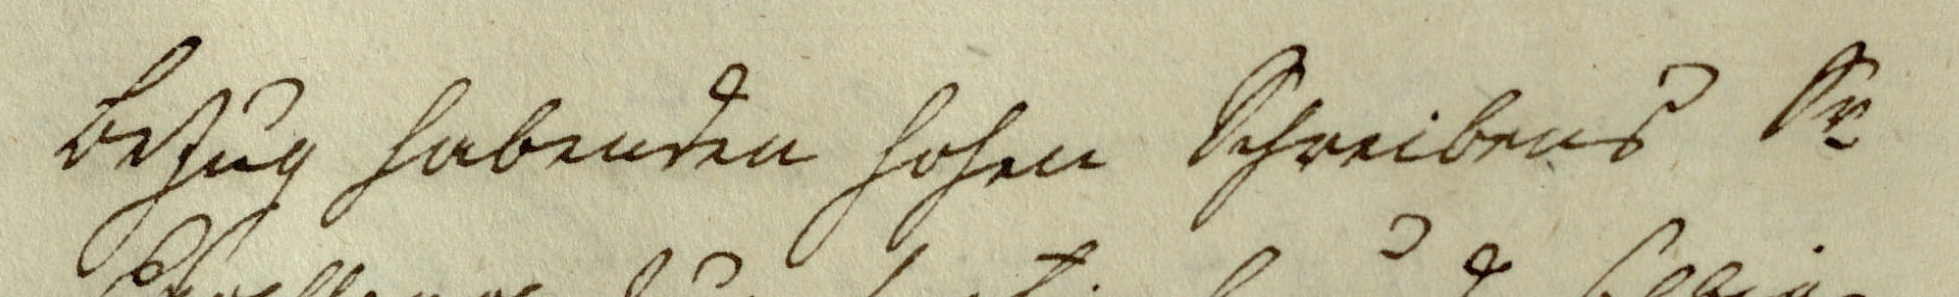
Bezug habenden hohen Schreibens Sr
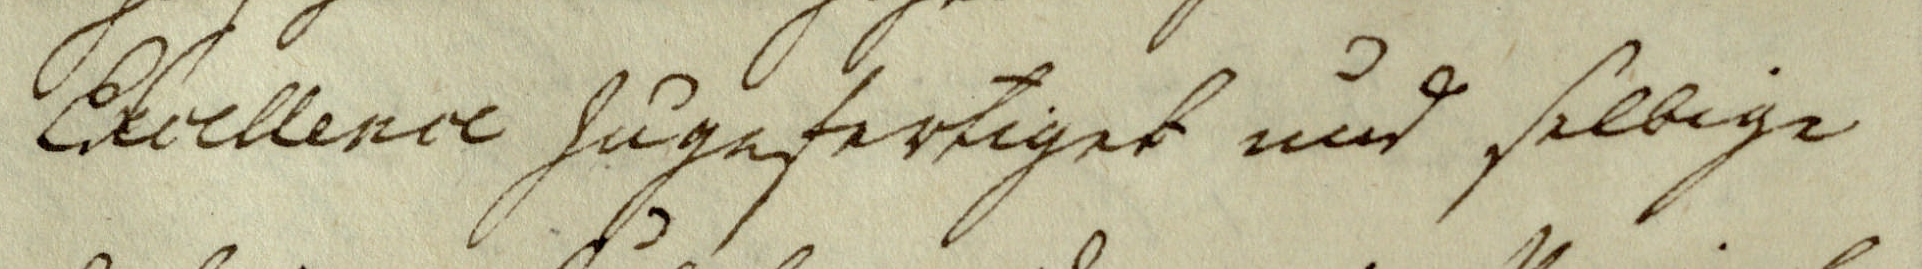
Excellence zugefertiget und selbige
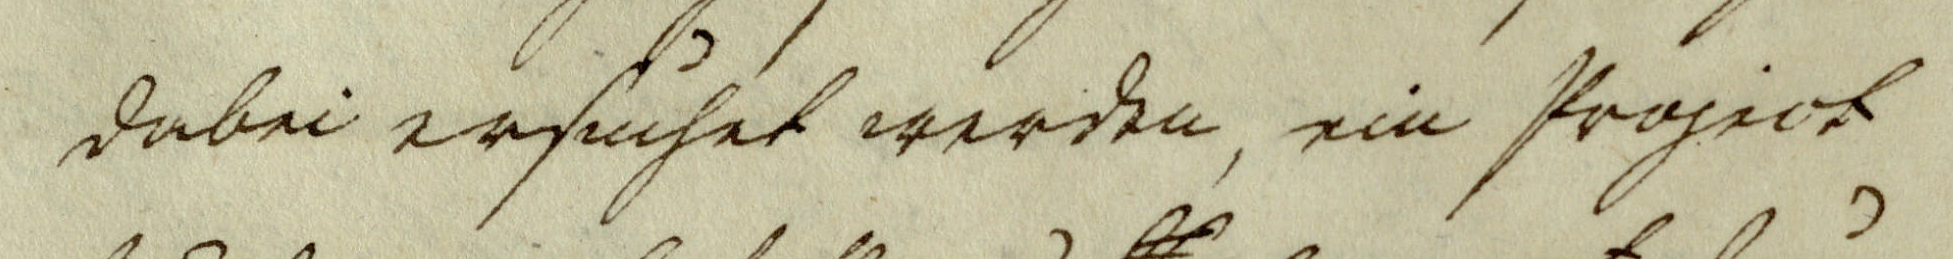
dabei ersuchet werden, ein Project
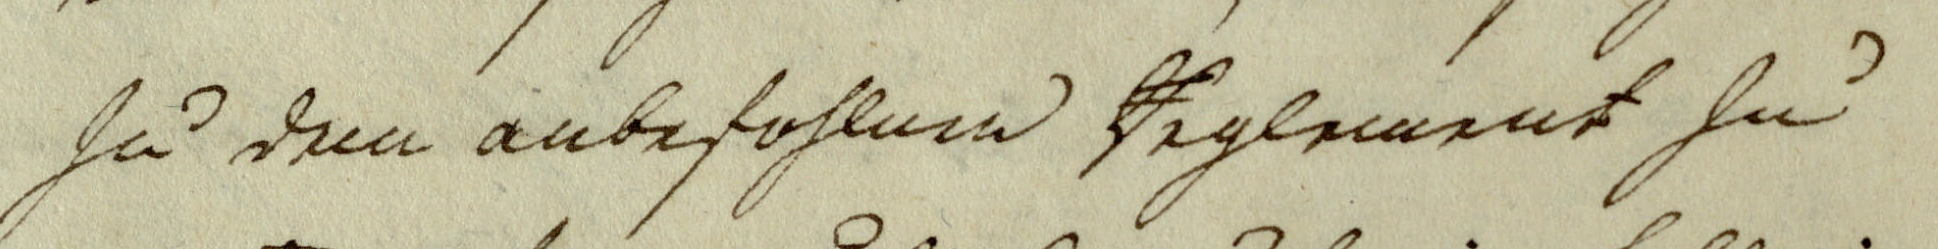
zu dem anbefohlnen Reglement zu
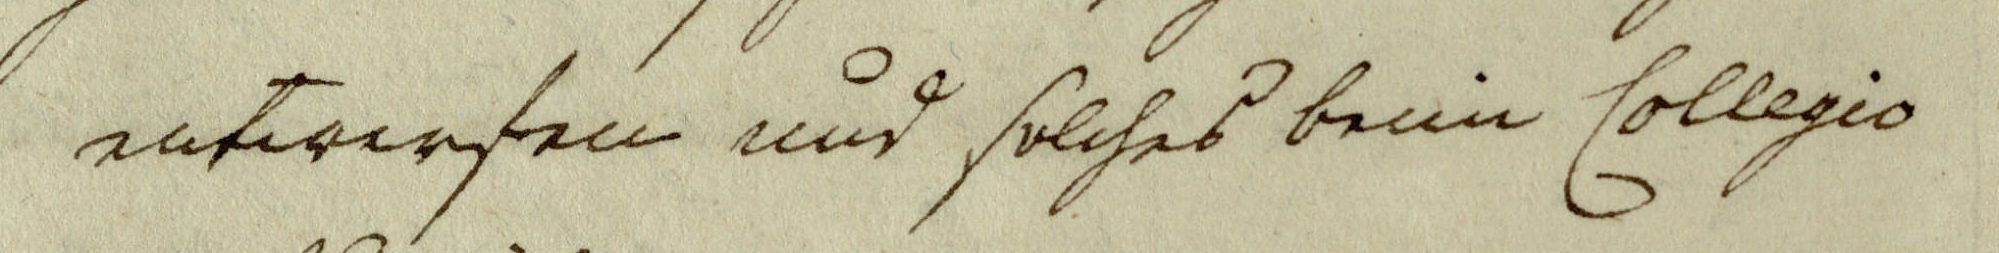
entwerfen und solches beim Collegio
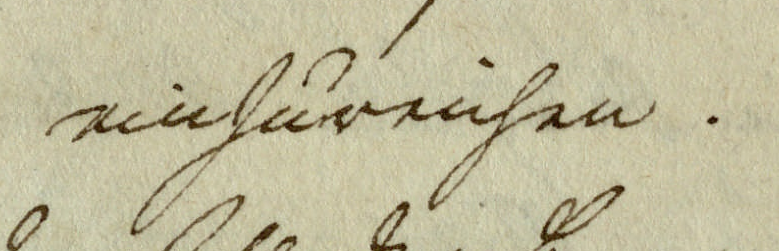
einzureichen.
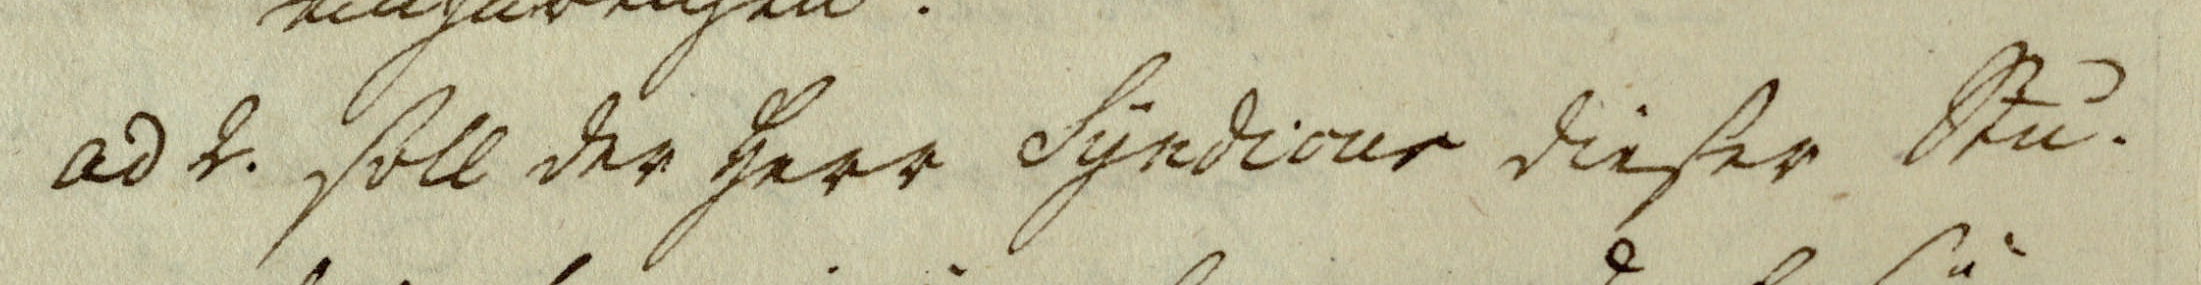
ad 2. soll der Herr Sÿndicus dieser Stu¬
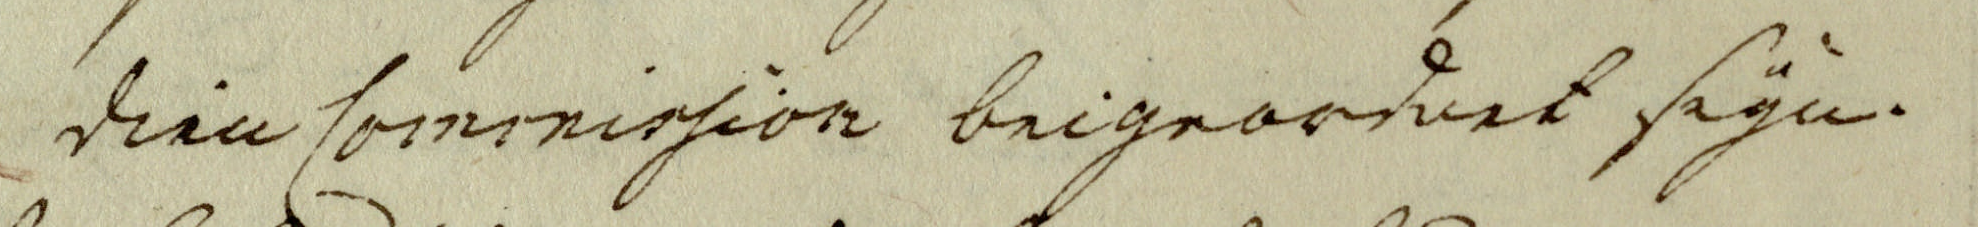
dien Commission beigeordnet seÿn.
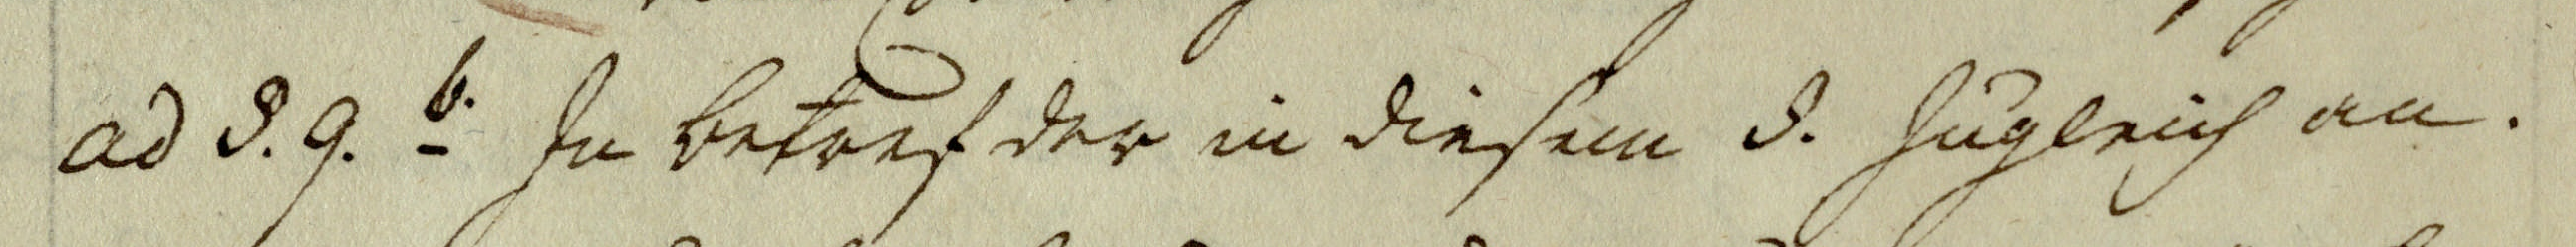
ad §. 9. b. In Betref der in diesem §. zugleich an¬
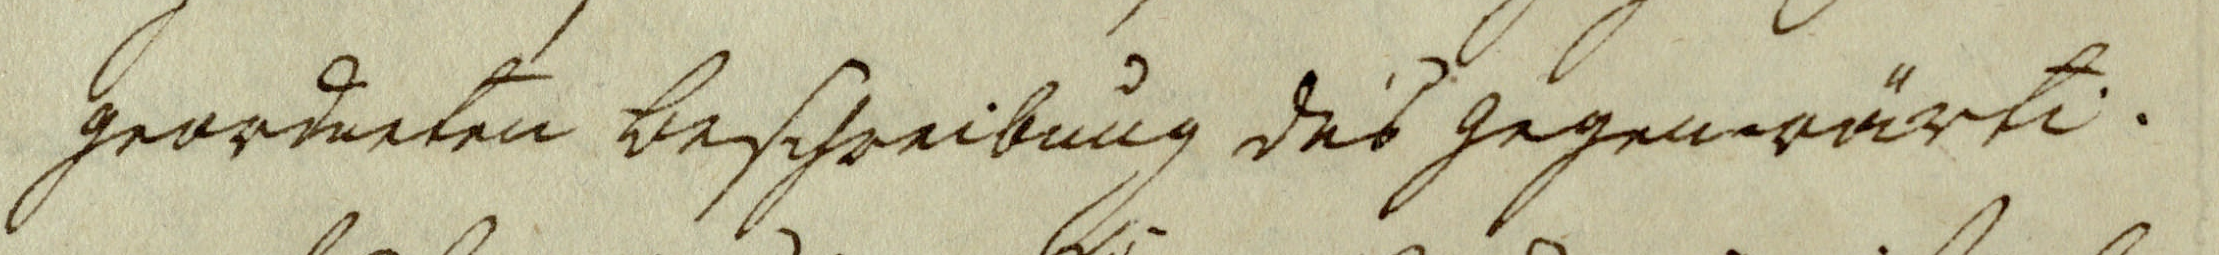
geordneten Beschreibung des gegenwärti¬
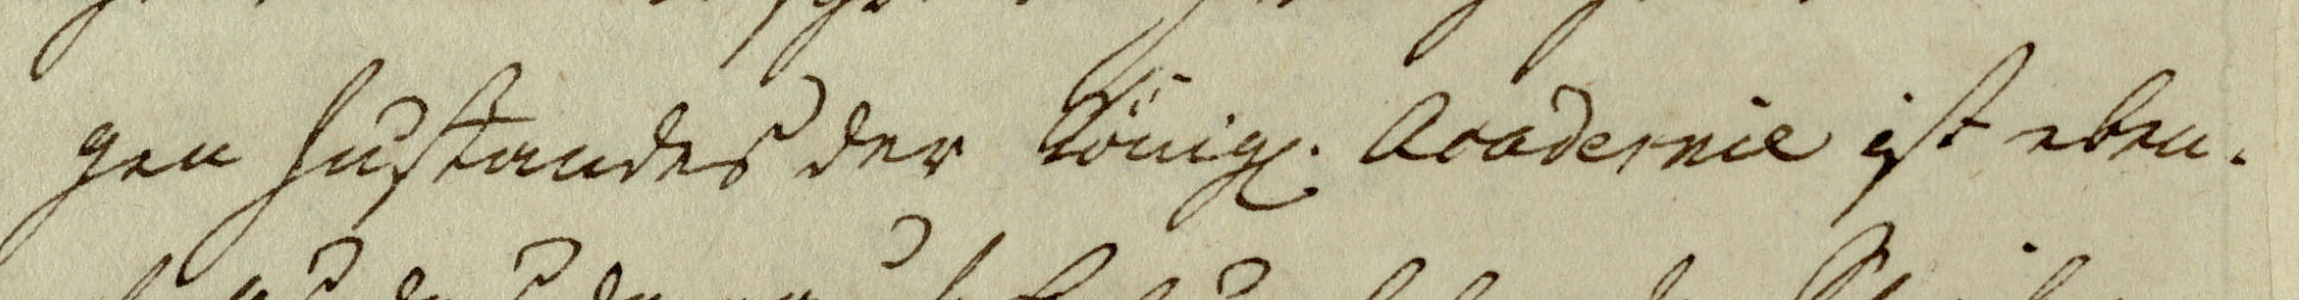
gen Zustandes der Königl. Academie ist eben¬
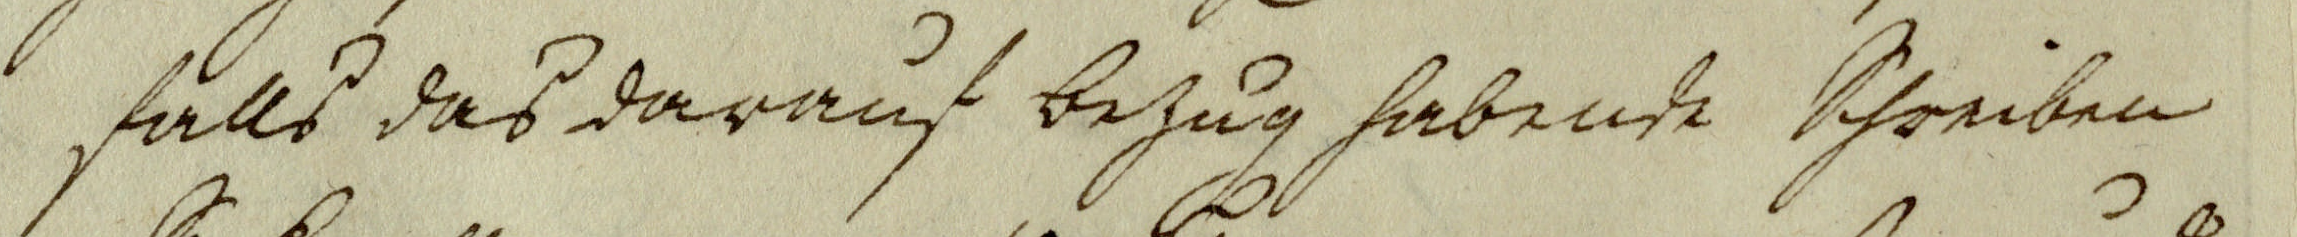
falls das darauf Bezug habende Schreiben
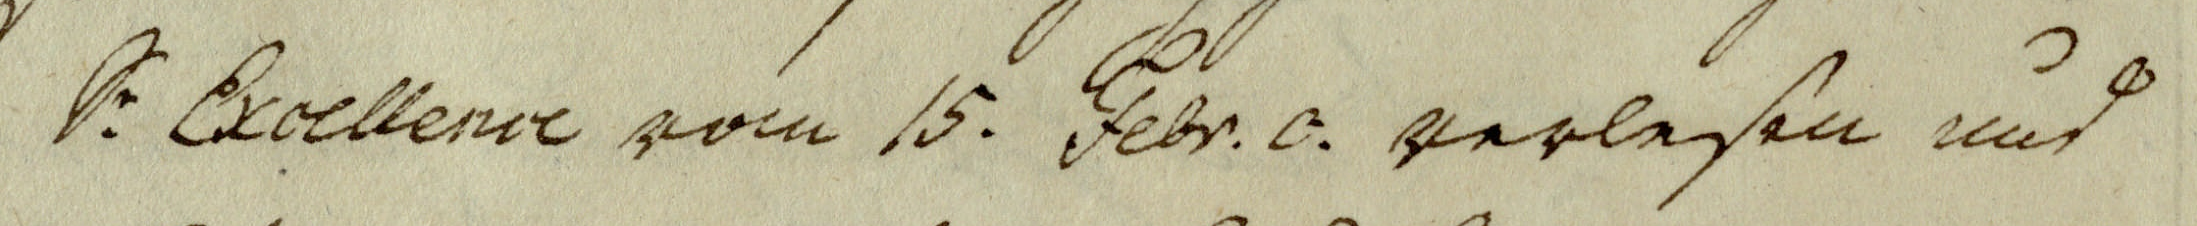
Sr Excellence vom 15. Febr. c. verlesen und
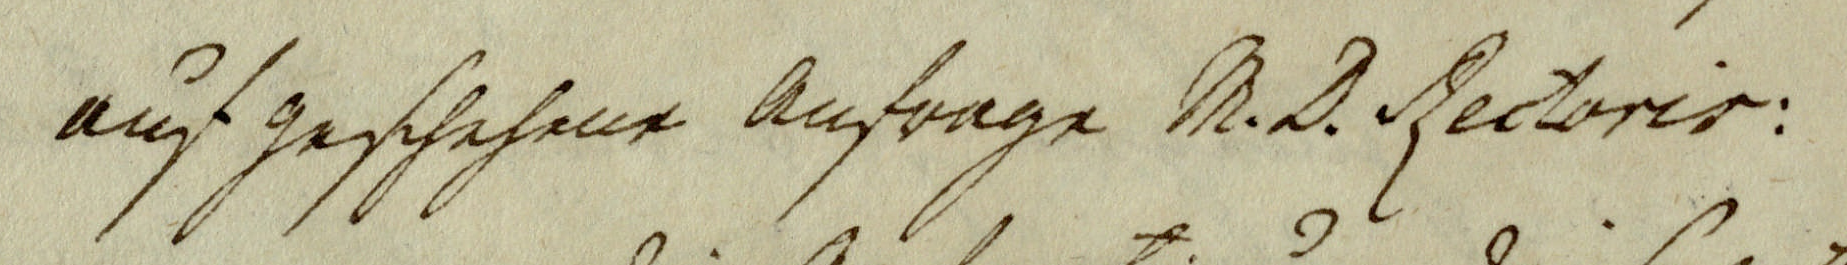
auf geschehene Anfrage M. D. Rectoris:
